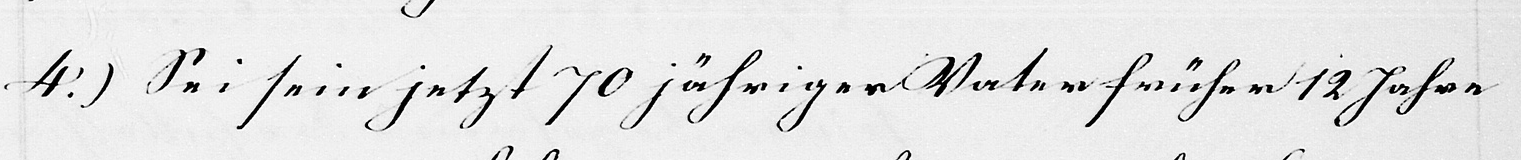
4.) Sei sein jetzt 70 jähriger Vater früher 12 Jahre
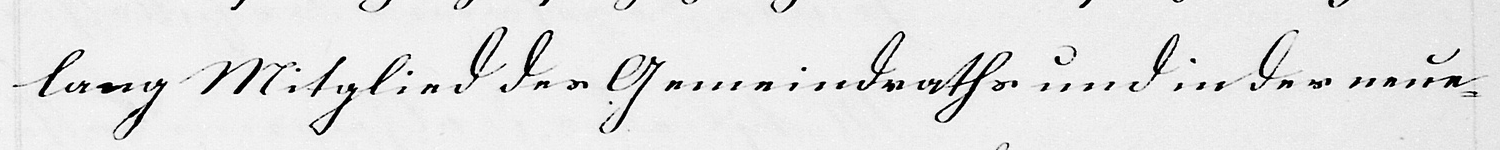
lang Mitglied des Gemeindraths und in der neue¬
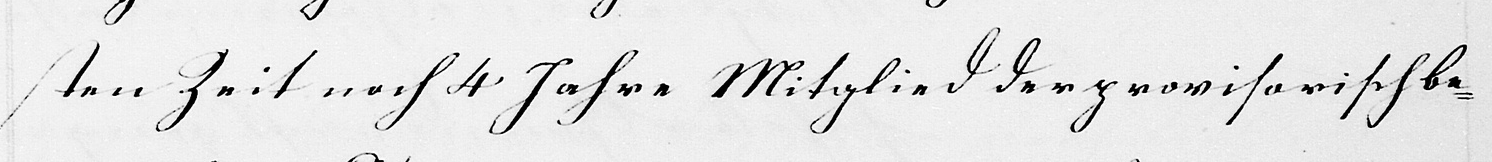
sten Zeit noch 4 Jahre Mitglied der provisorisch be¬
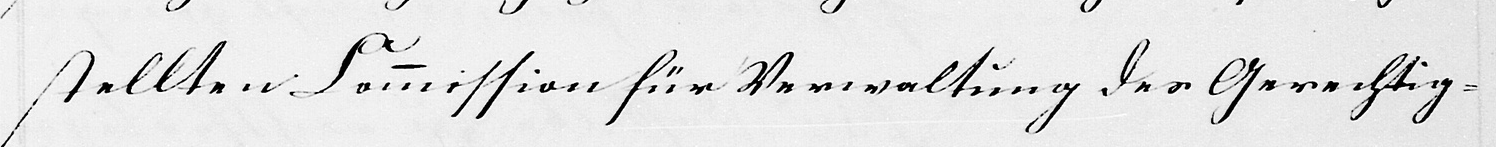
stellten Commission für Verwaltung des Gerechtig¬
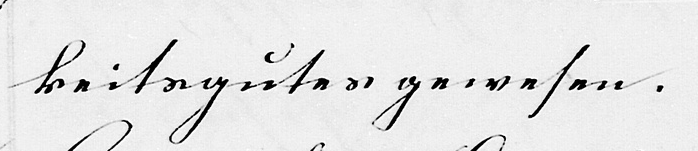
keitsgutes gewesen.
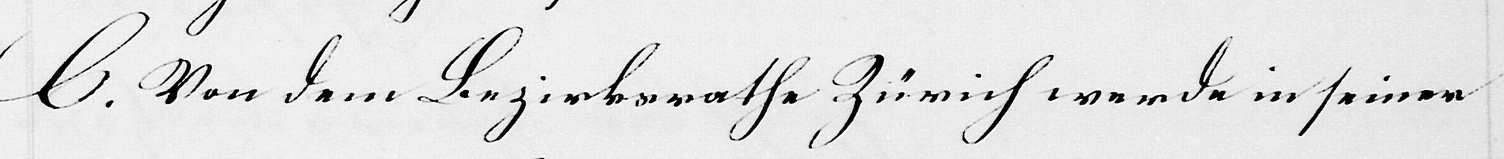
C. Von dem Bezirksrathe Zürich werde in seiner
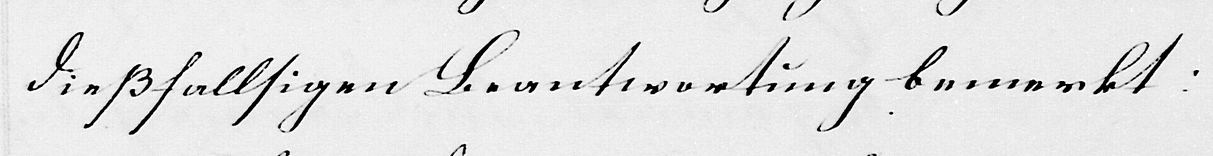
dießfallsigen Beantwortung bemerkt:
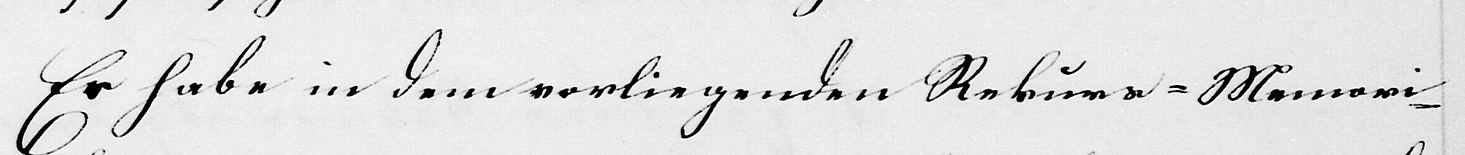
Er habe in dem vorliegenden Rekurs-Memori¬
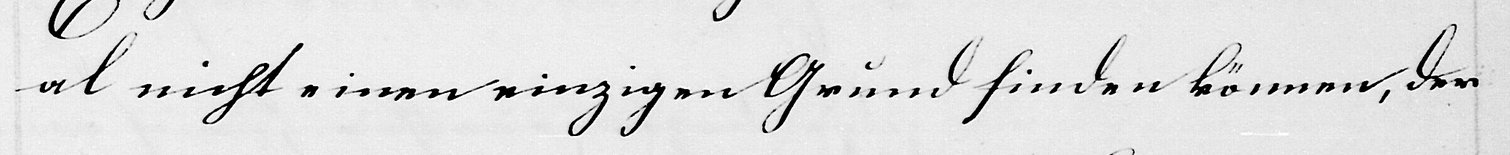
al nicht einen einzigen Grund finden können, der
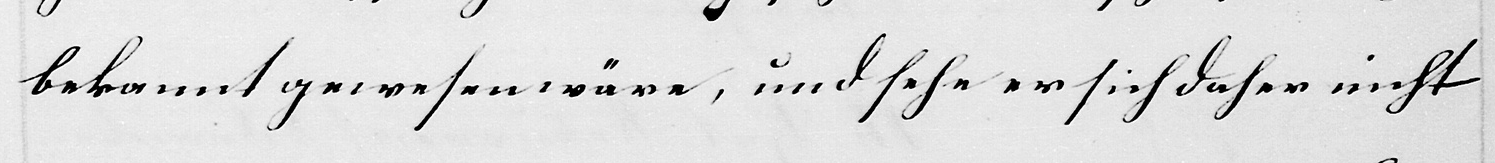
bekannt gewesen wäre, und sehe er sich daher nicht
